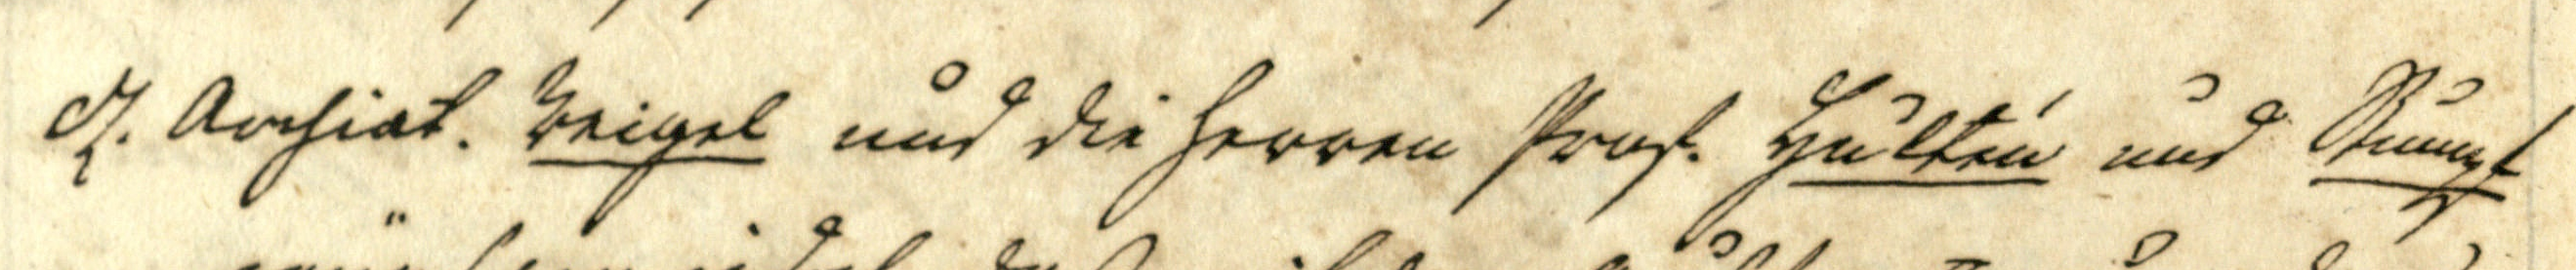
dh. Archiat. Weigel und die Herren Prof. Hultén und Stumpf
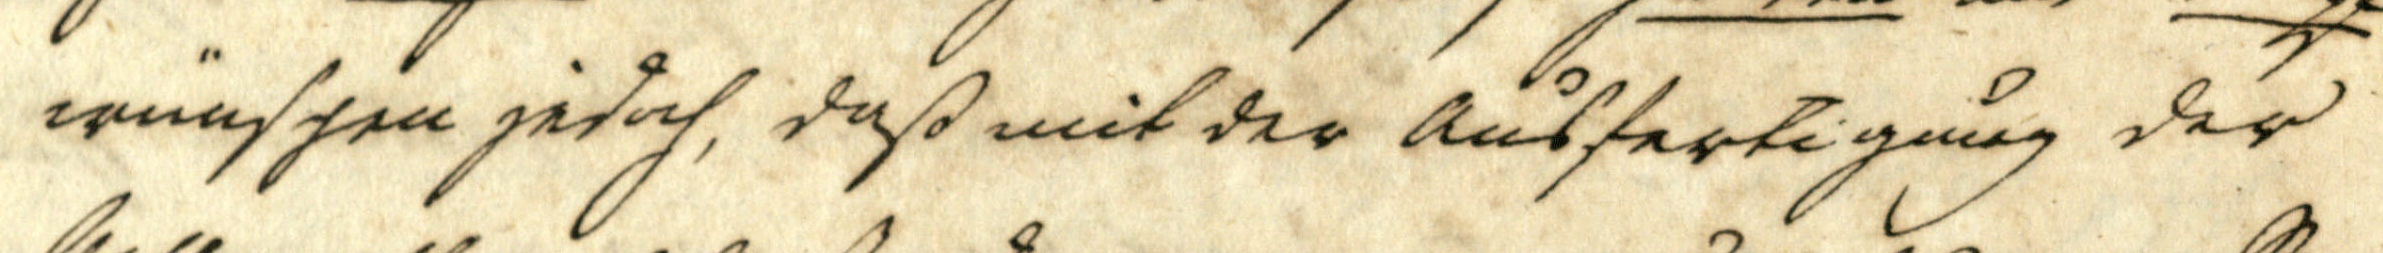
wünschen jedoch, daß mit der Ausfertigung der
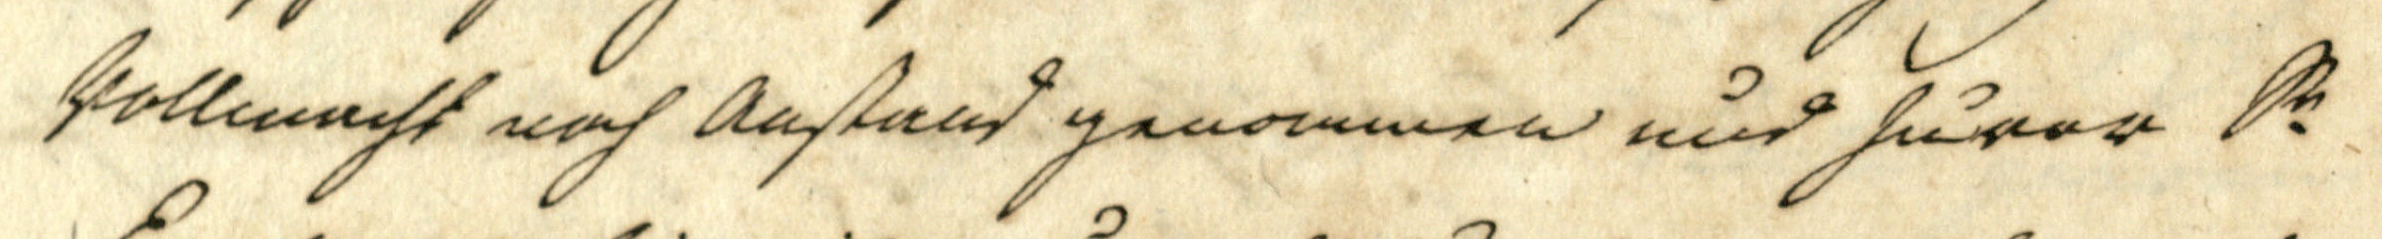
Vollmacht noch Anstand genommen und zuvor Sr.
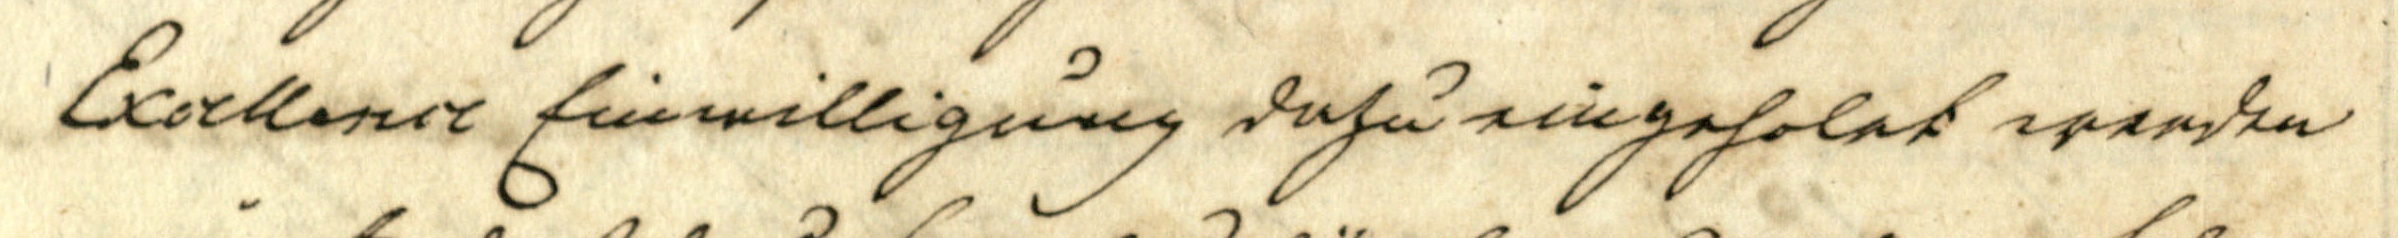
Excellence Einwilligung dazu eingeholet werden
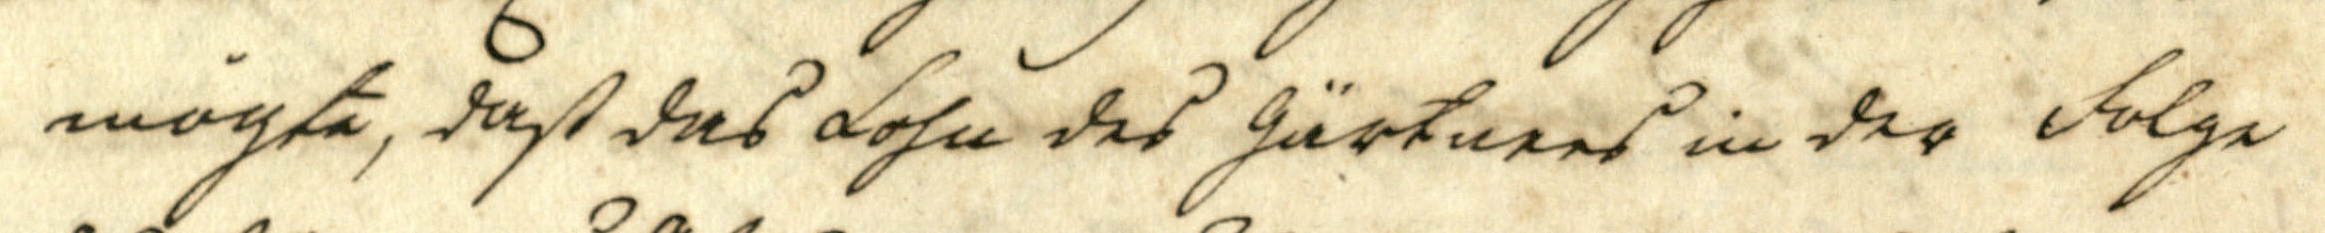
mögte, daß das Lohn des Gärtnens in der Folge
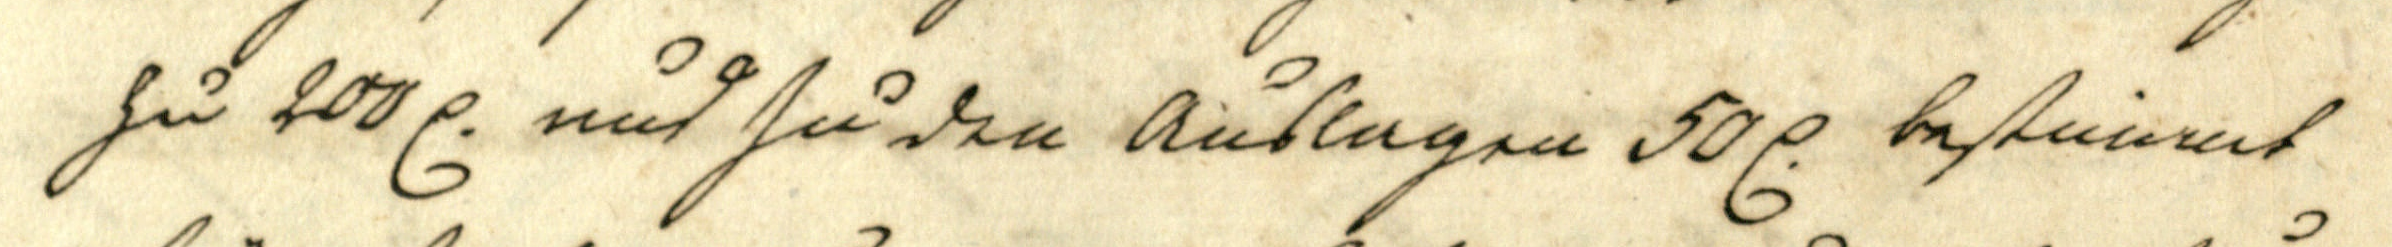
zu 200 l. und zu den Auslagen 50 l. bestimmt
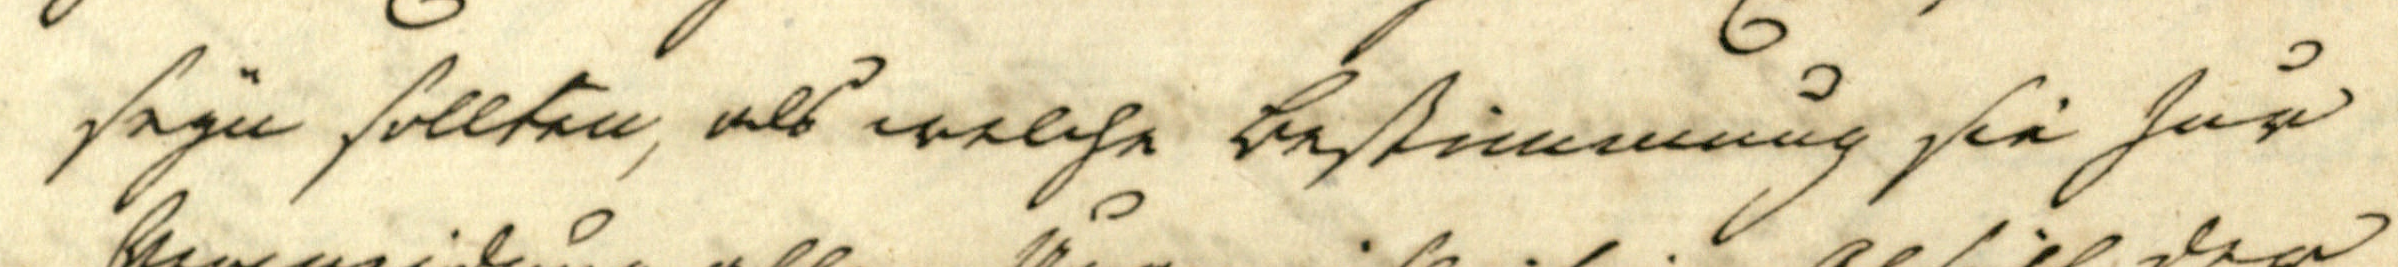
seÿn sollten, als welche Bestimmung sie zur
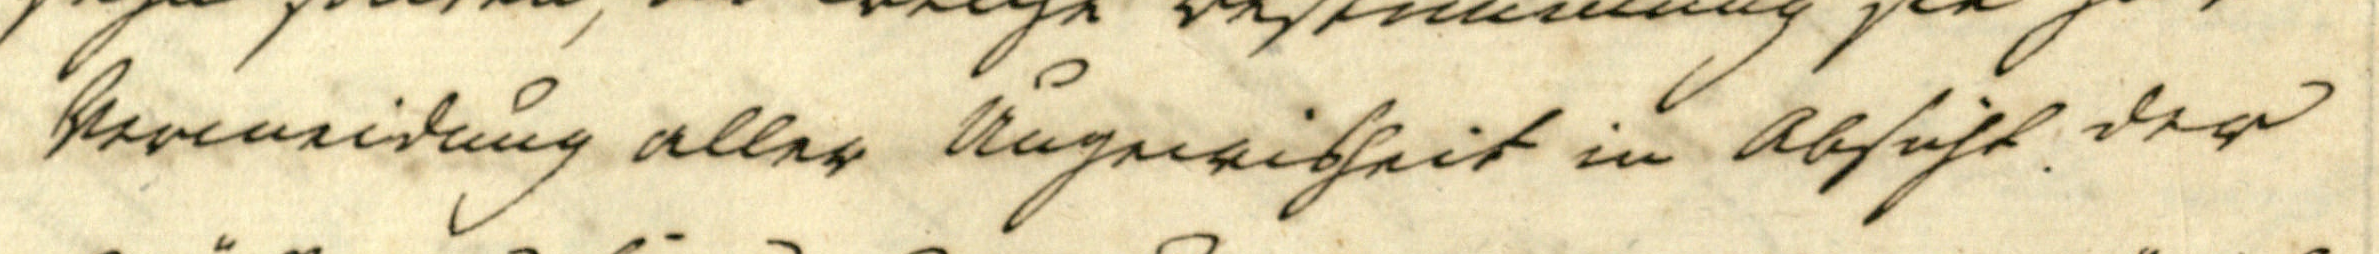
Vermeidung aller Ungewisheit in Absicht der
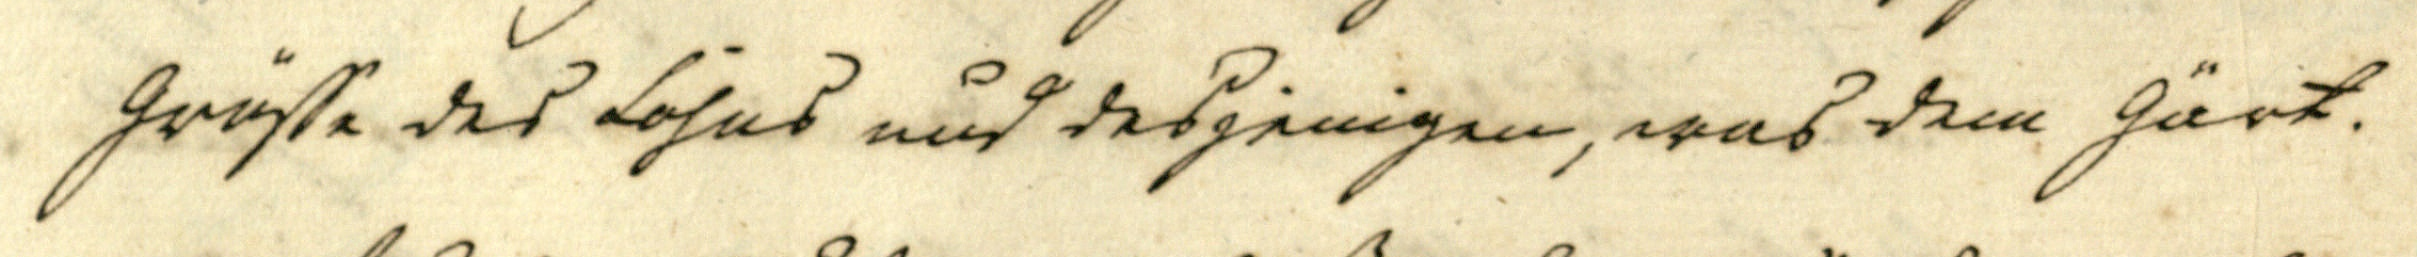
Grösse des Lohns und desjenigen, was dem Gärt¬
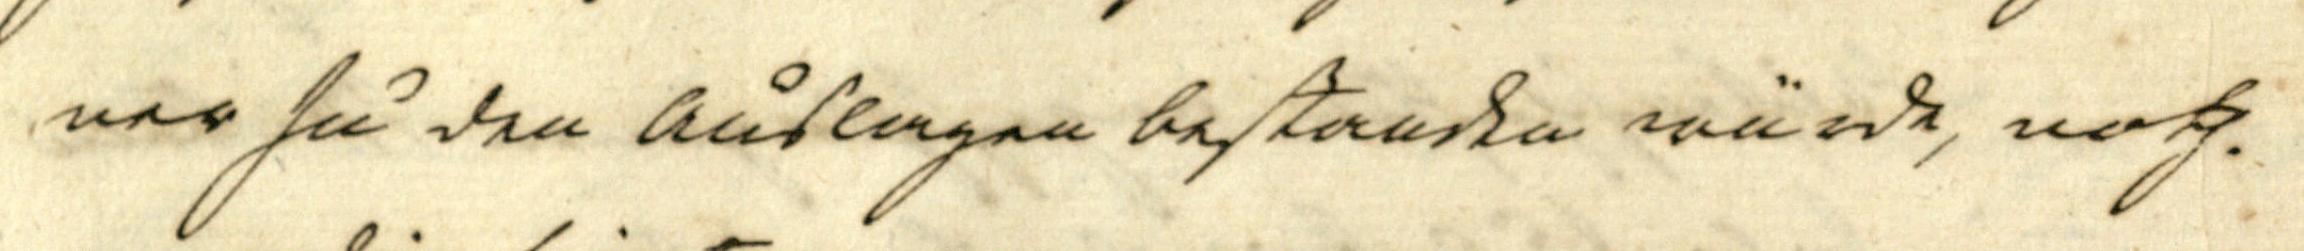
ner zu den Auslagen bestanden würde, noth¬
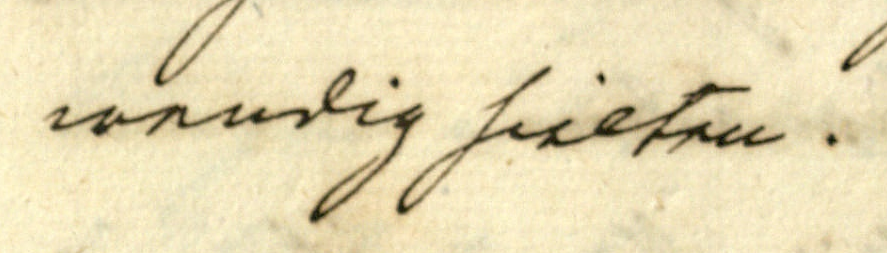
wendig hielten.
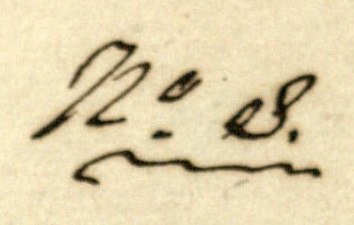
No 8 .
